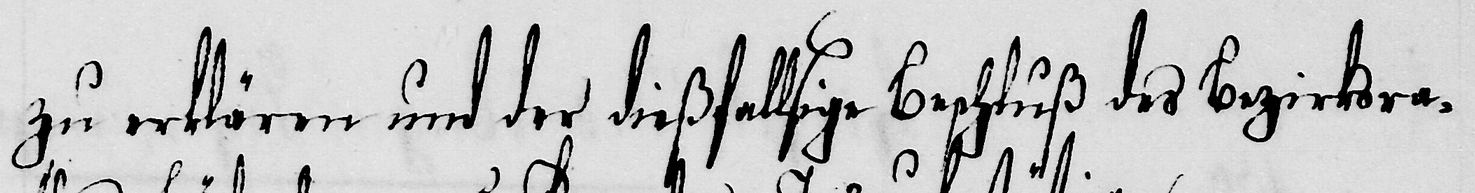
zu erklären und der dießfallsige Besch¬
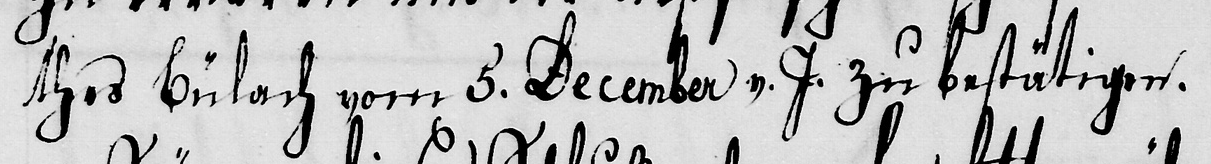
athes Bülach vom 5. December v. J. zu bestätigen.
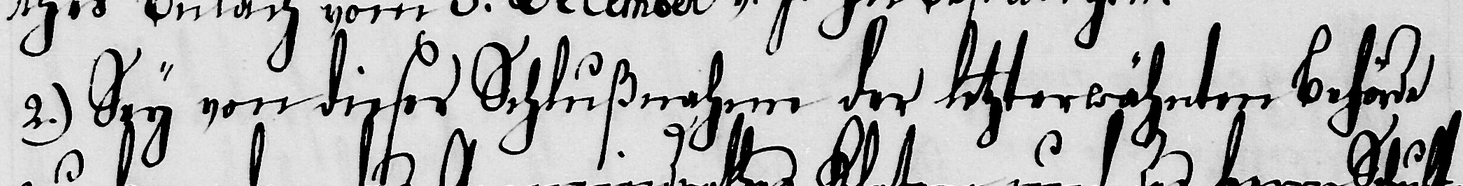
2.) Sey von dieser Schlußnahme der letzterwähnten Behörde
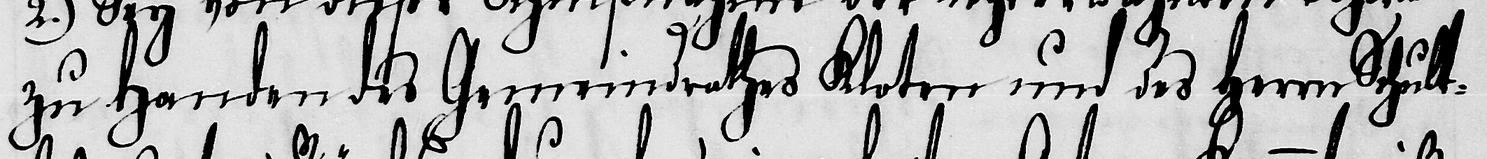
zu Handen des Gemeindrathes Kloten und des Herrn Schul¬
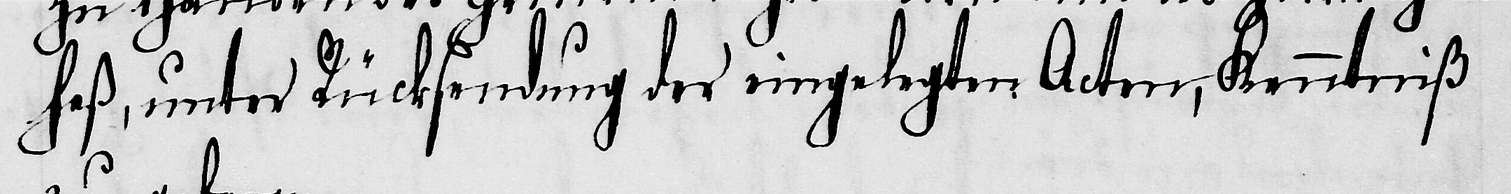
theß, unter Rücksendung der eingelegten Acten, Kenntniß
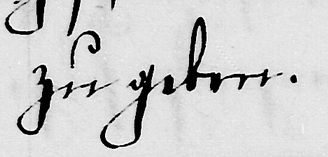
zu gegeben.
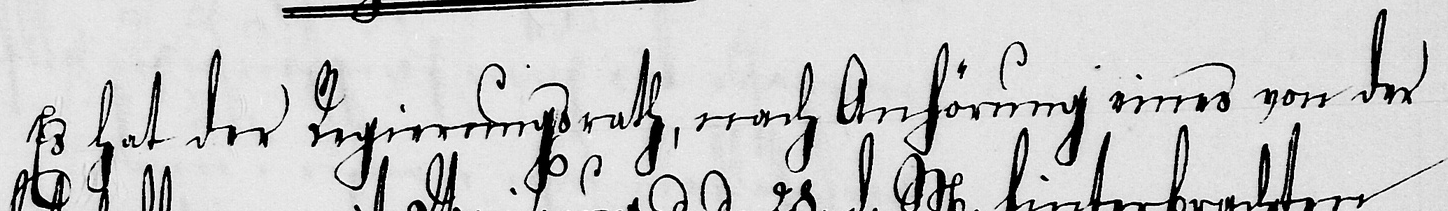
Es hat der Regierungsrath, nach Anhörung eines von der
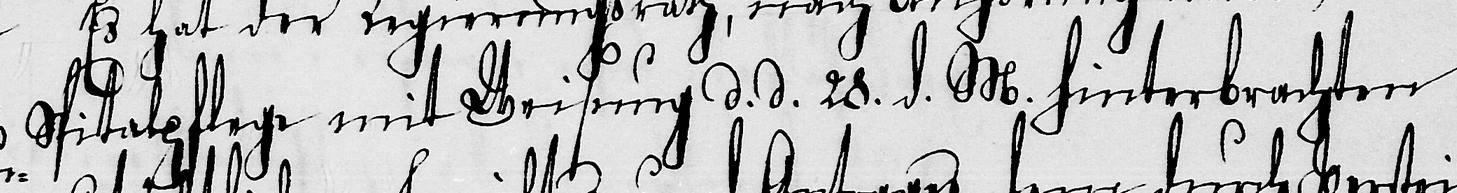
Spitalpflege mit Weisung d. d. 28. d. M. hinterbrachten
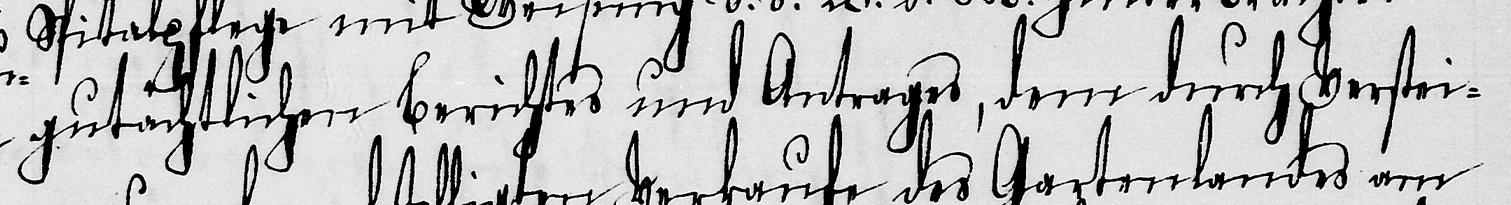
gutächtlichen Berichtes und Antrages, dem durch Verstei¬
